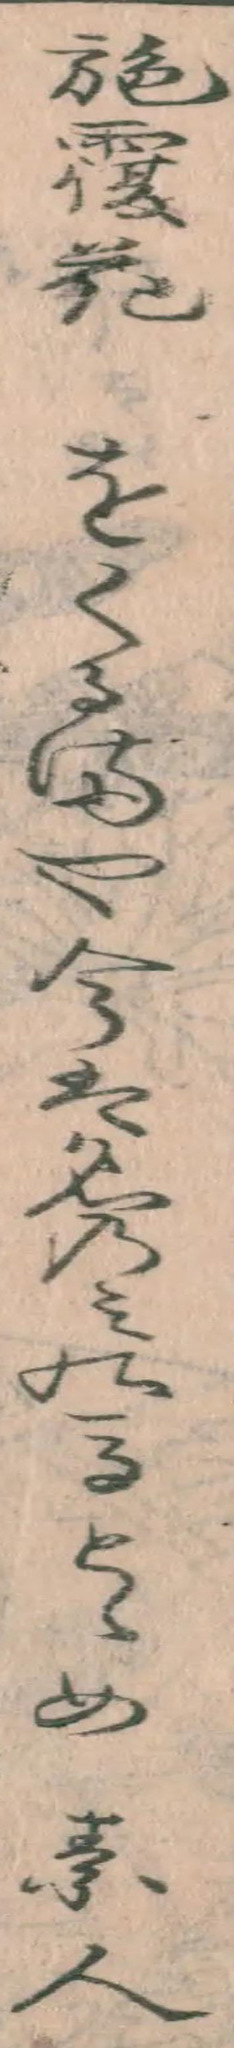旋覆花をくるまや今は名のみの馬とゝめ素人
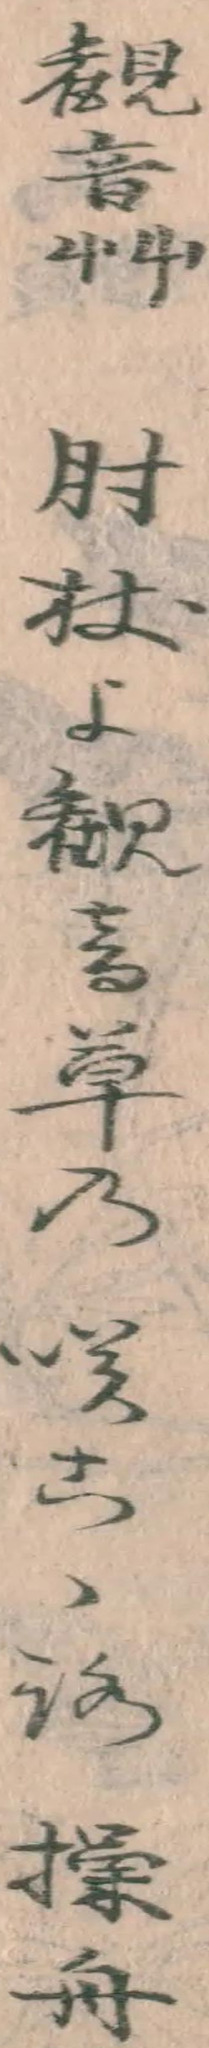観音草肘杖よ観音草の咲こゝろ操舟
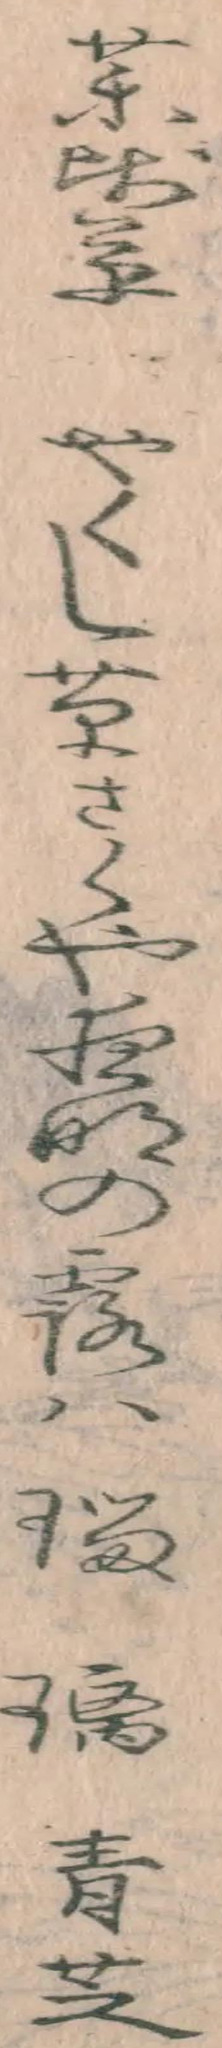薬師草やくし草さくや夜明の露は瑠璃青芝
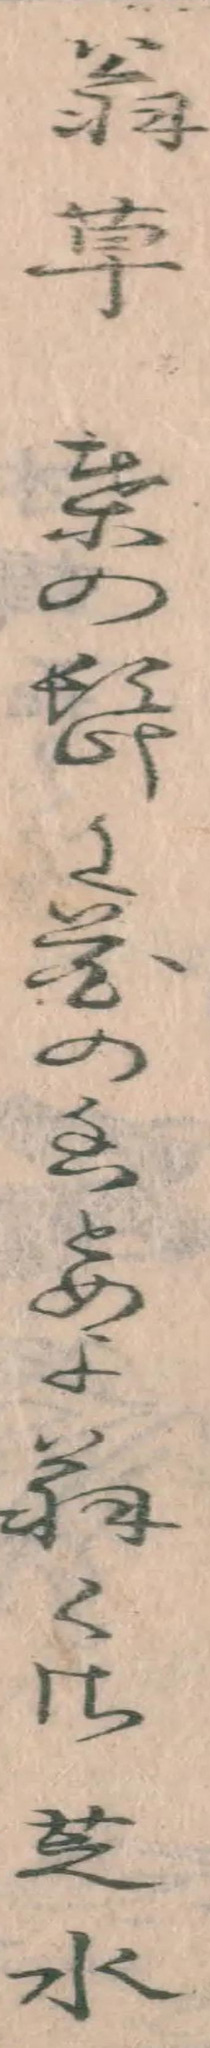翁草葉の髭に花の香とめよ翁くさ芝水
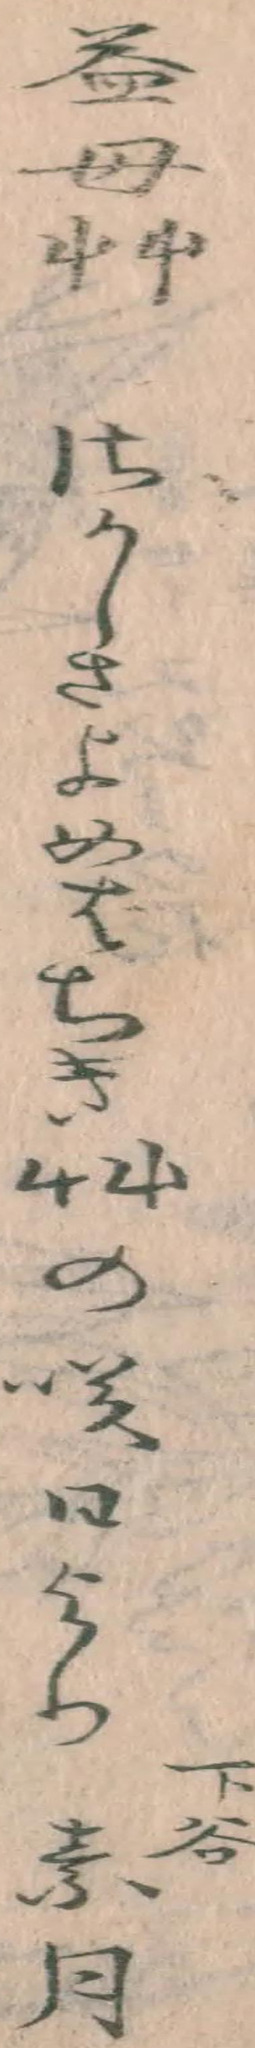益母草さかしさよめはちき草の咲日より下谷素月
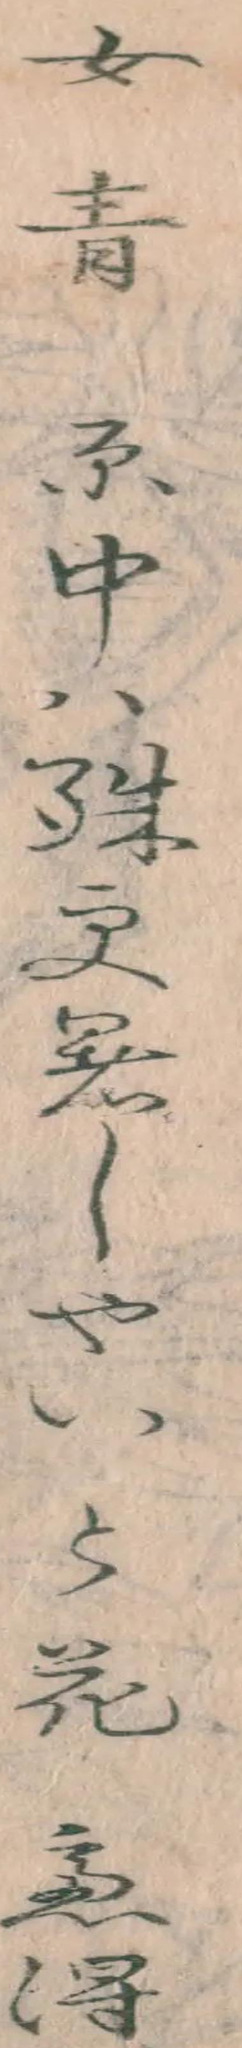女青草中は殊更暑しやいと花慮得
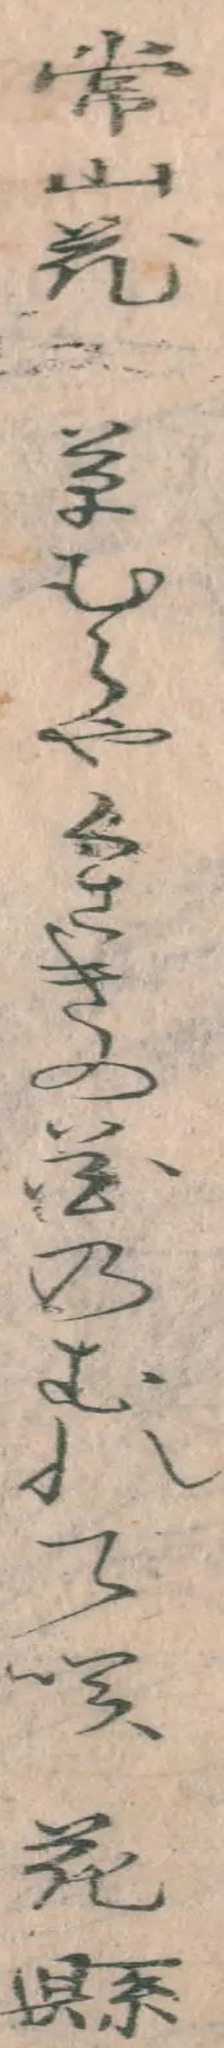常山花草むらやくさきの花のむれて咲花縣
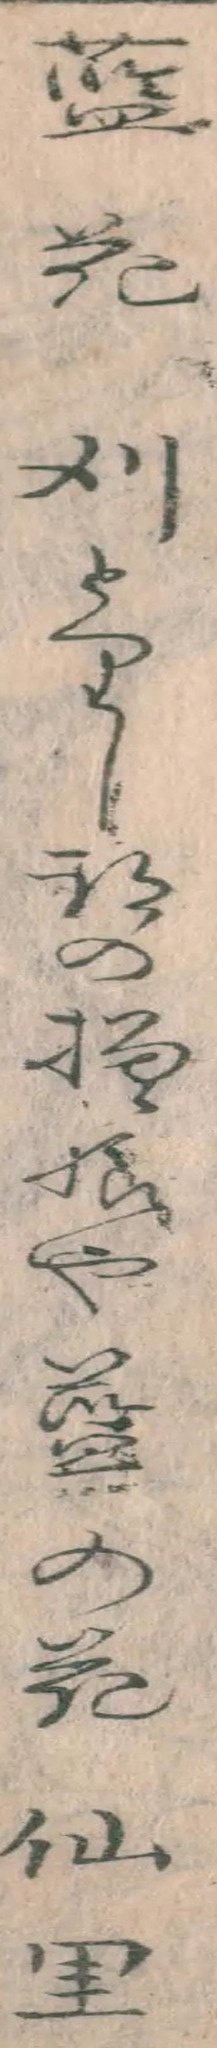藍花刈りとりし跡の模様や藍の花仙里
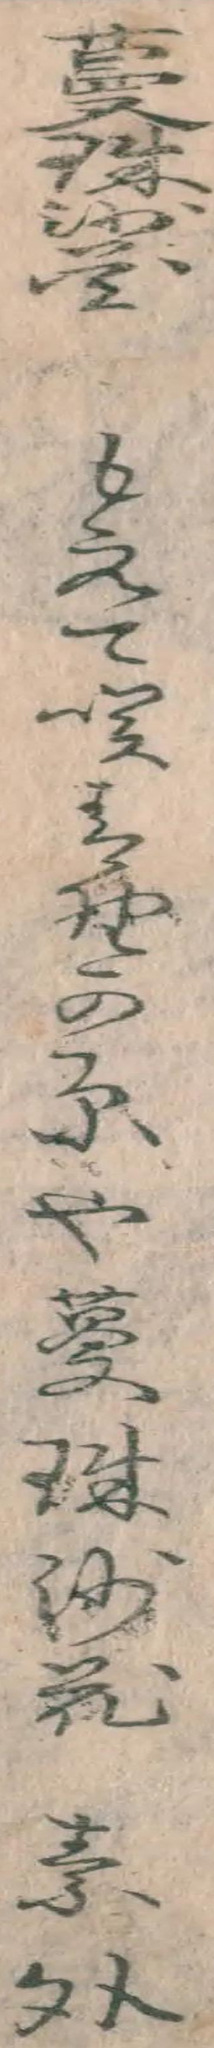蔓珠沙花もえて咲すかたの草や蔓珠沙花素外
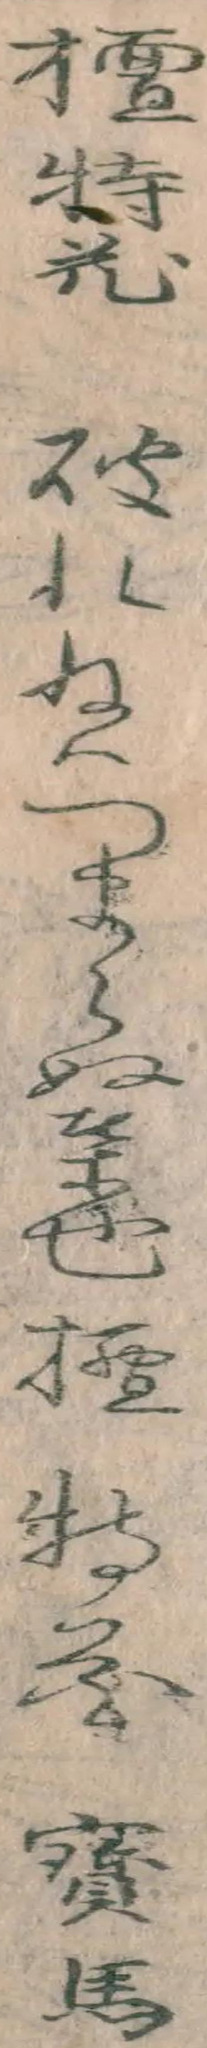檀特花破れねはつまらぬ葉也檀特花寶馬

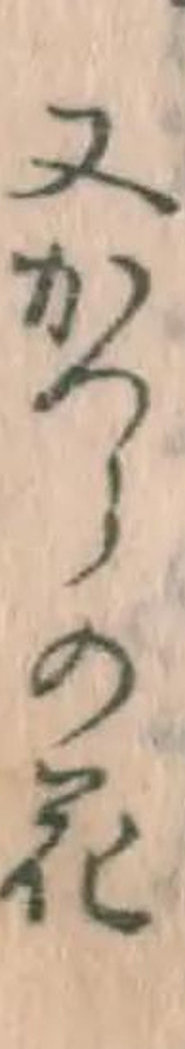又かつらの花
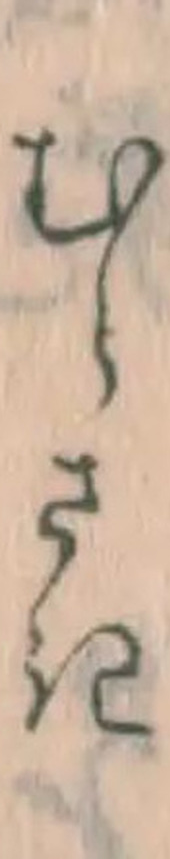むらさき
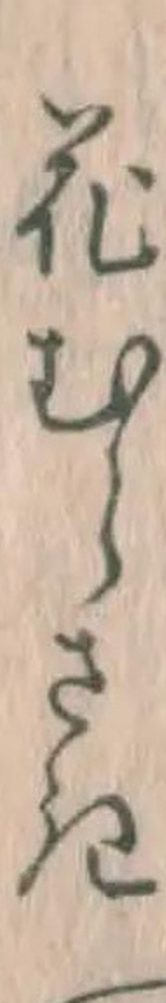花むらさき
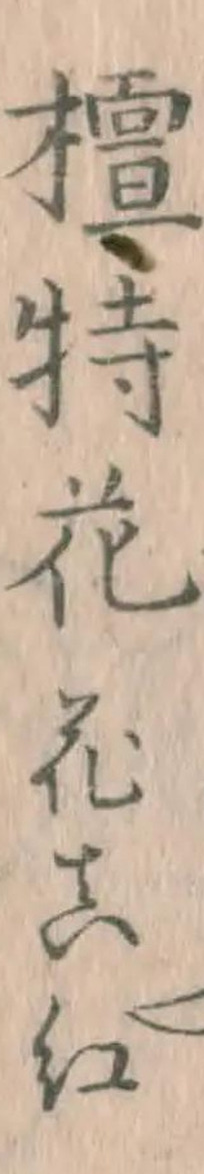檀特花花こい紅

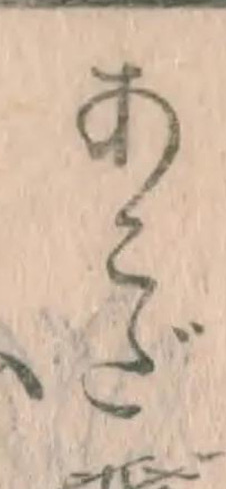あこだ
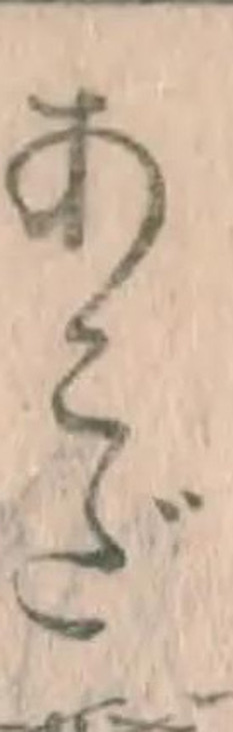あこだ
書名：誹諧名知折 2巻. [2]
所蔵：国立国会図書館 National Diet Library, JAPAN
